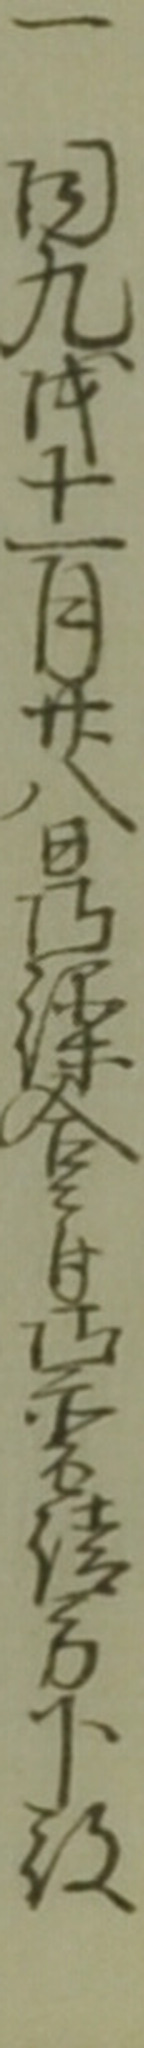一同九戌十一月廿八日御繰合ニ付御普請方下役
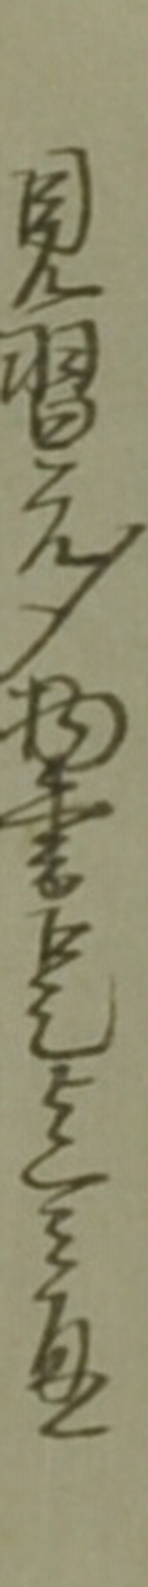見習元〆物書是迄之通
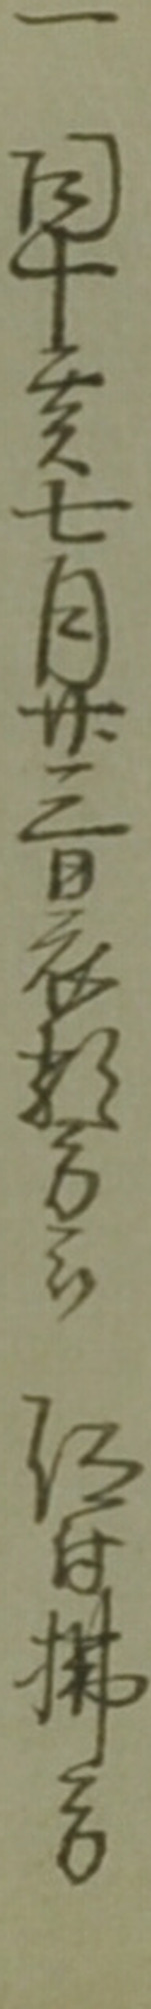一同十亥七月廿三日衣類被仰付払方
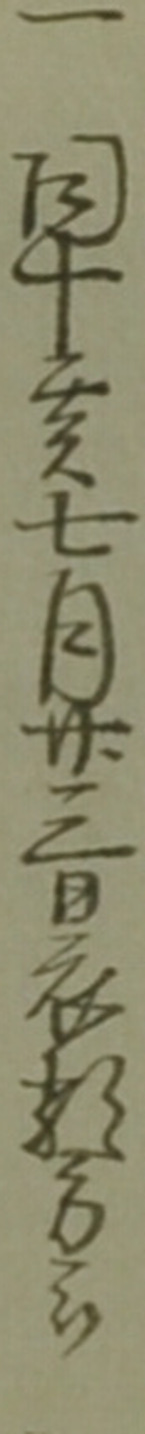一同十亥七月廿三日衣類被仰付払方
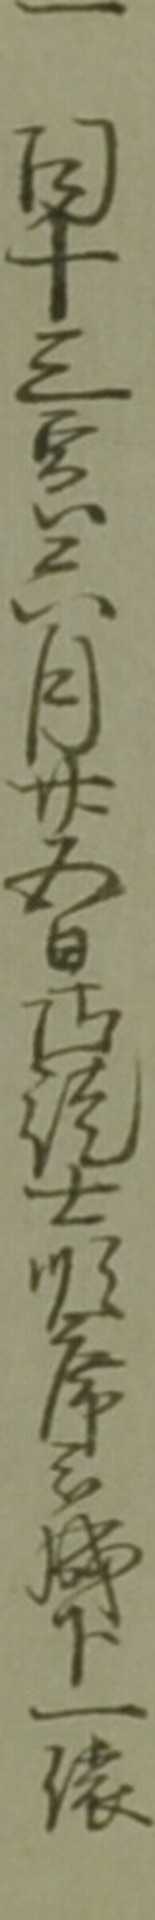一同十三寅六月廿五日御徒士順席被成下一俵
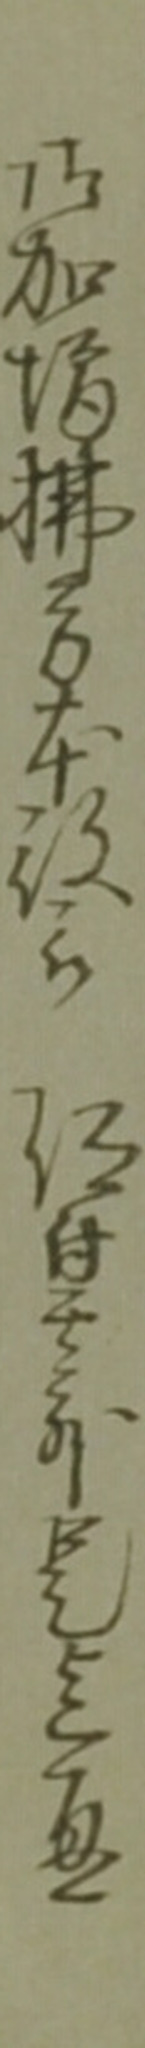御加増払方本役被仰付其外是迄之通
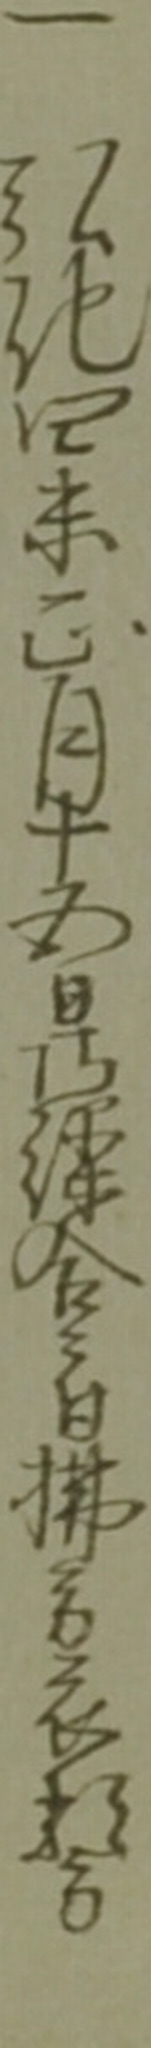一弘化四未正月十五日御繰合ニ付払方衣類方
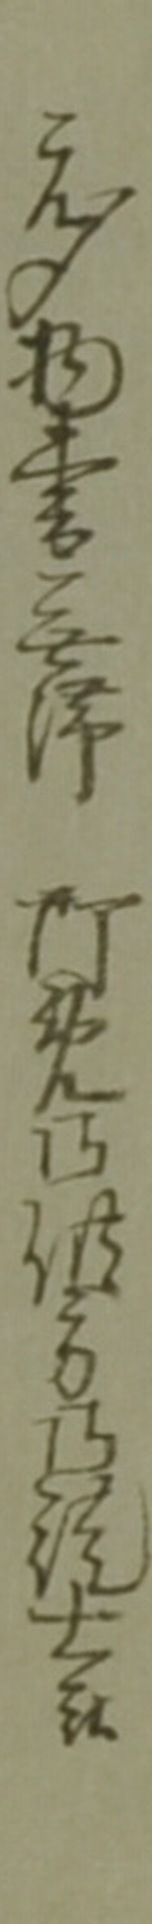元〆物書無滞御免御供方御徒士被
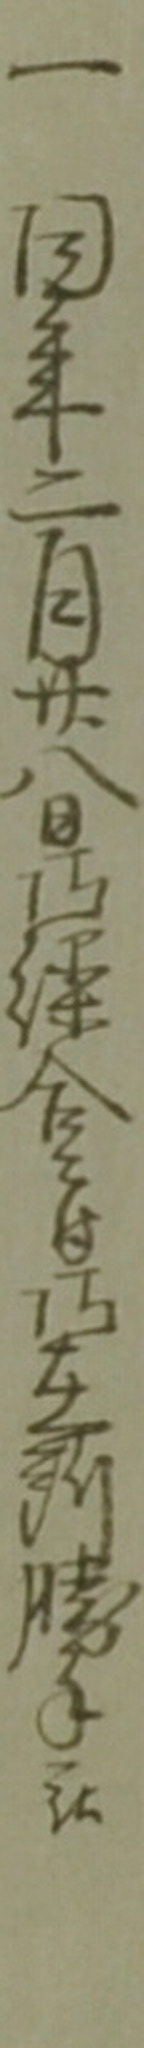一同年ニ月廿八日御繰合ニ付御在所勝手被
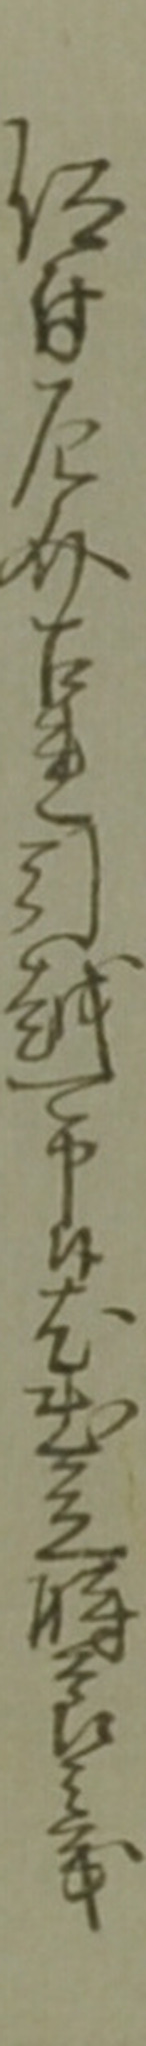仰付厄介召連引越可申候尤出立時節之義
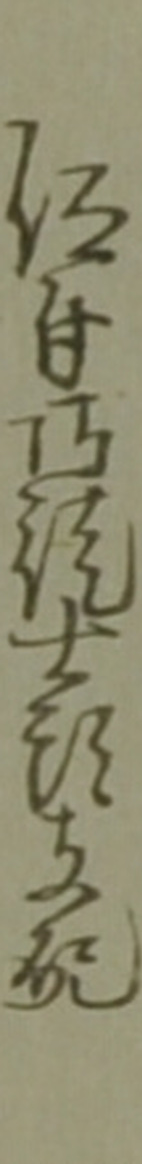仰付御徒士頭支配
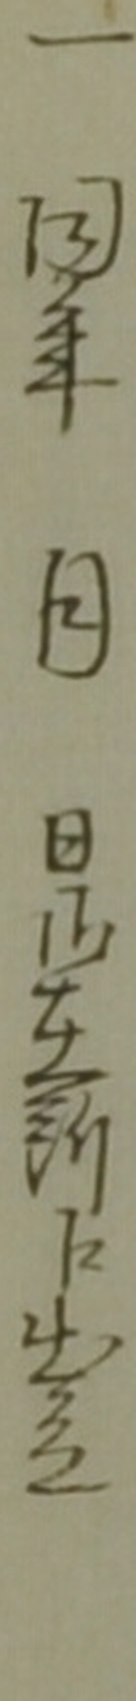一同年月日御在所江出立
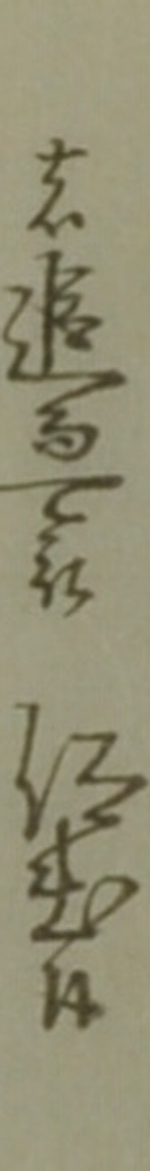者追而可被仰出候
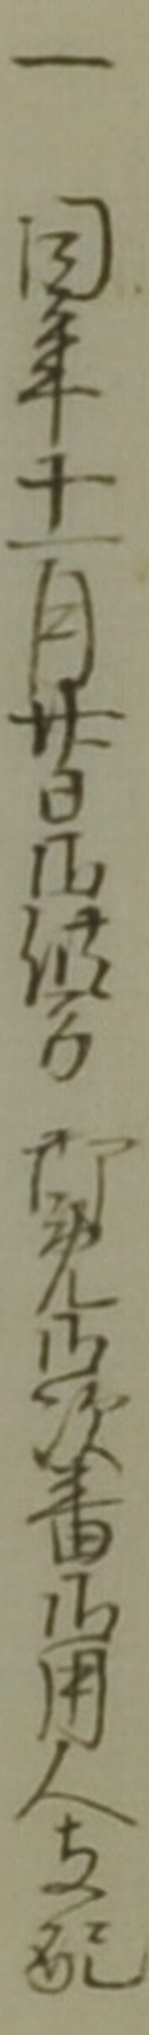一同年十一月廿日御供方御免御次番御用人支配

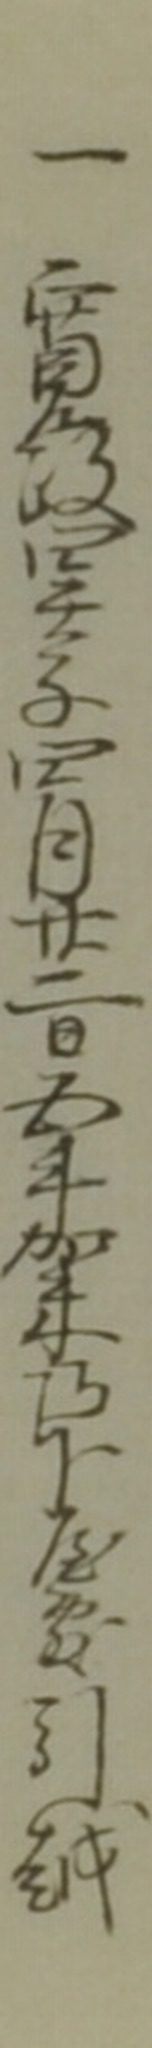一寛政四壬子詞四月廿二日五斗加米御下屋敷引越
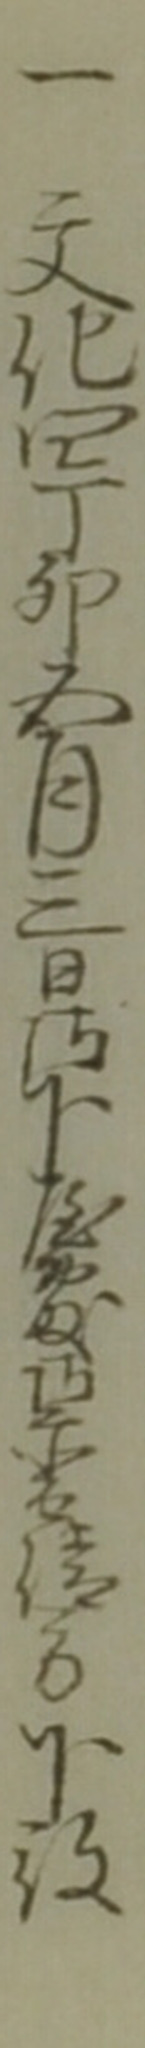一文化四丁卯五月三日御下屋敷御普請方下役
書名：無足諸士勤仕録（八）
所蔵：伊那市立高遠町図書館・合同会社AMANE
